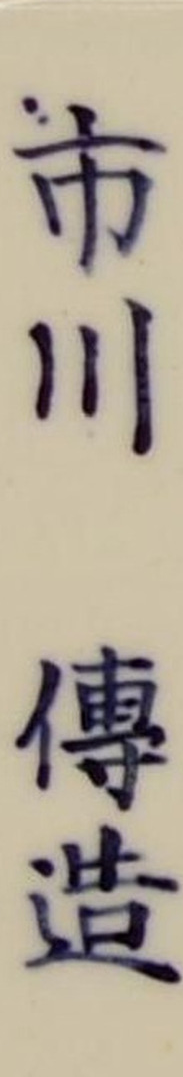市川傳造
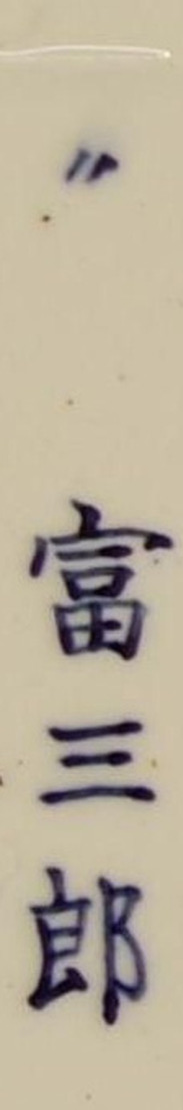富三郎
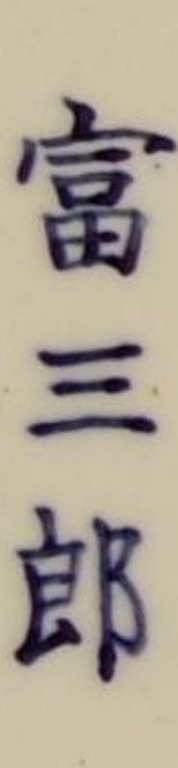富三郎
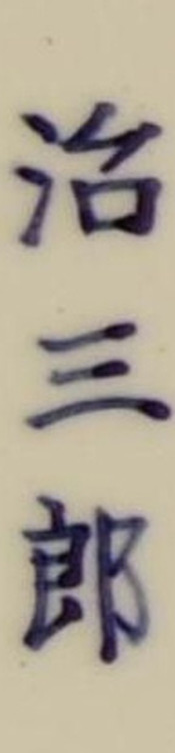治三郎

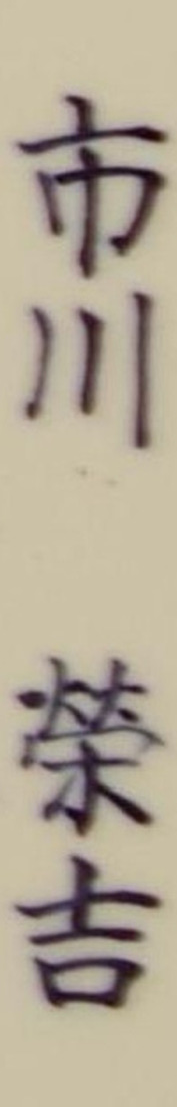市川榮吉
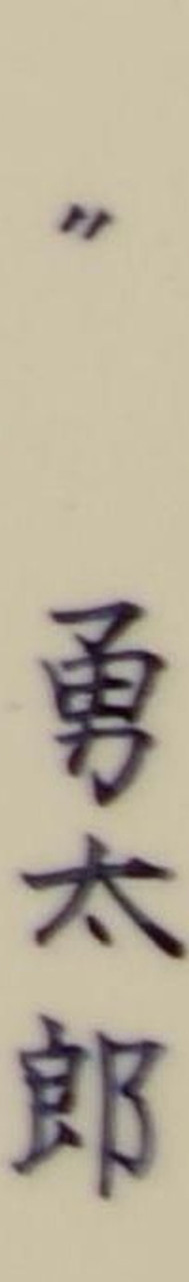勇太郎
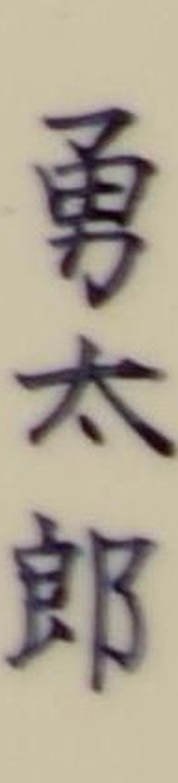勇太郎
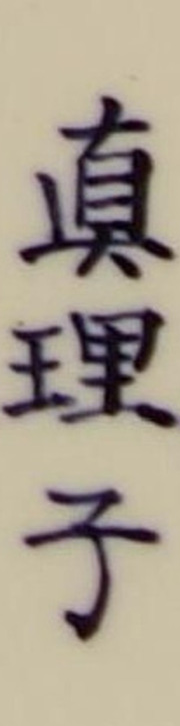真理子
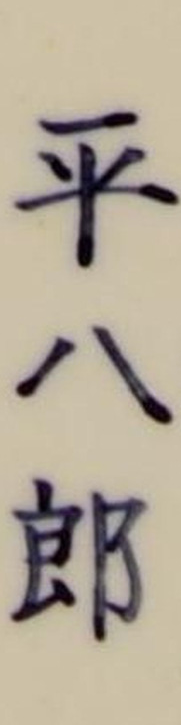平八郎
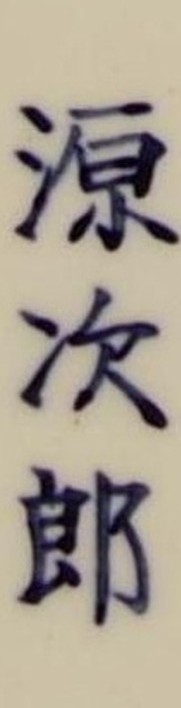源次郎
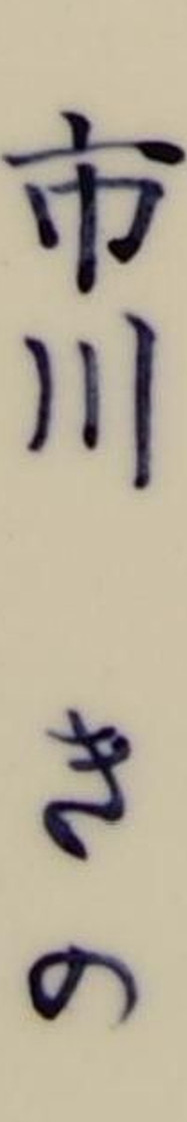市川きの
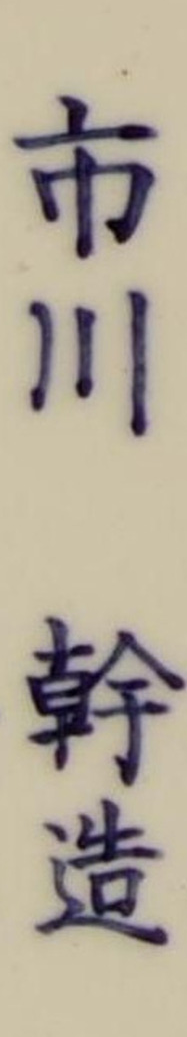市川幹造
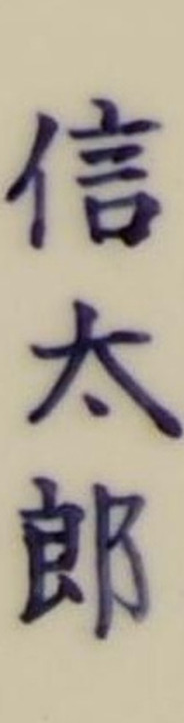信太郎
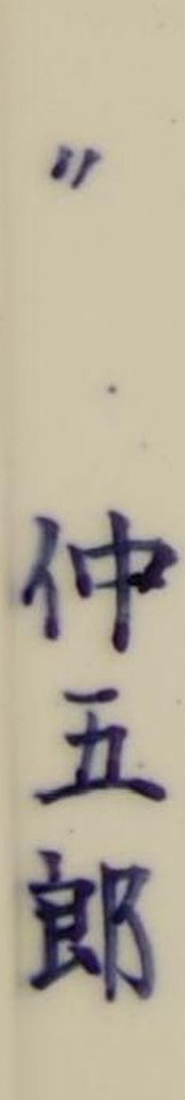仲五郎
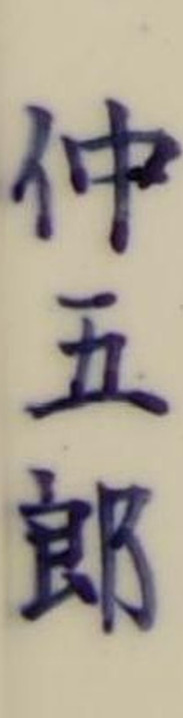仲五郎

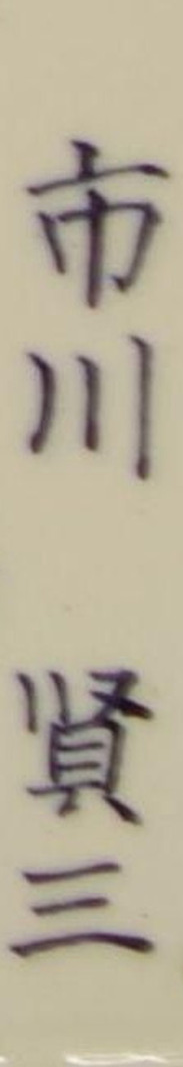市川賢三
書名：A~D
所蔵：koyasan kongobuji
